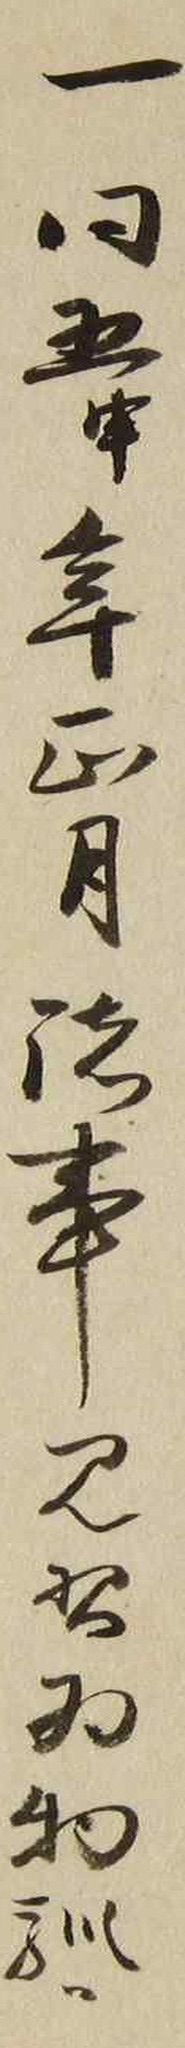一同五申年正月諸事見習為物馴候
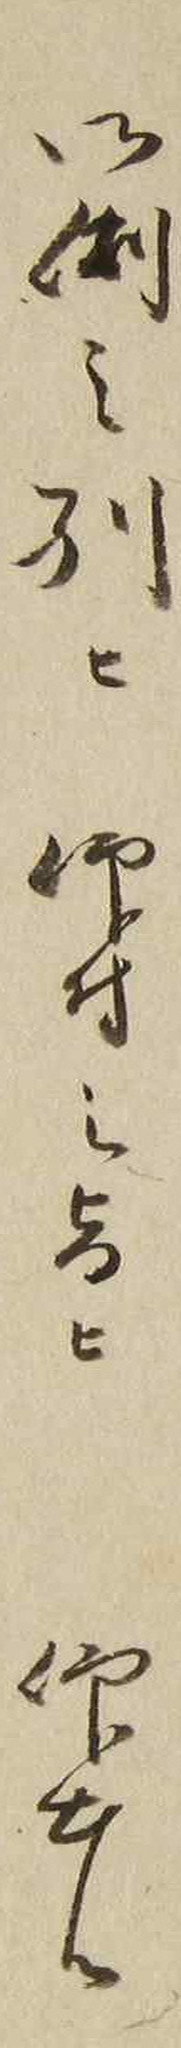御側之列被仰付之旨被仰出候
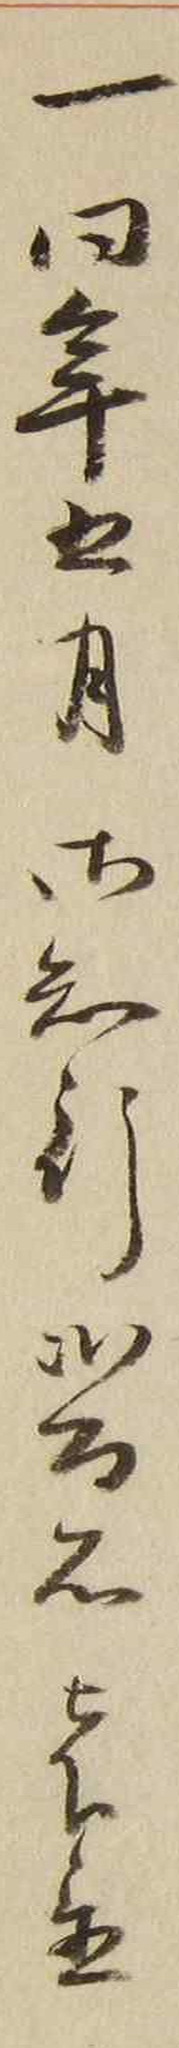一同年五月御知行弐百石被下置

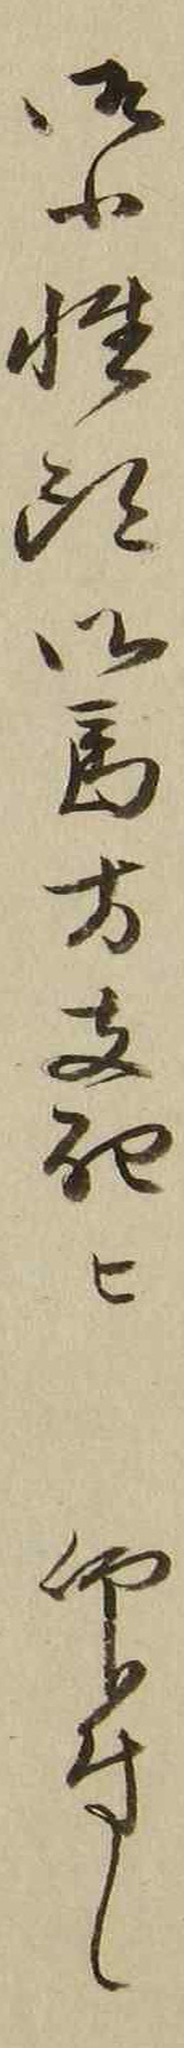御小姓頭御馬方支配被仰付候
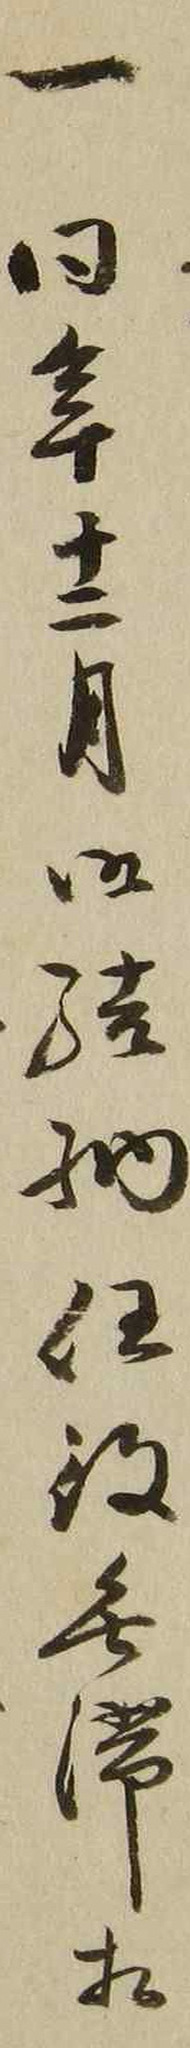一同年十二月御結納任役無滞相
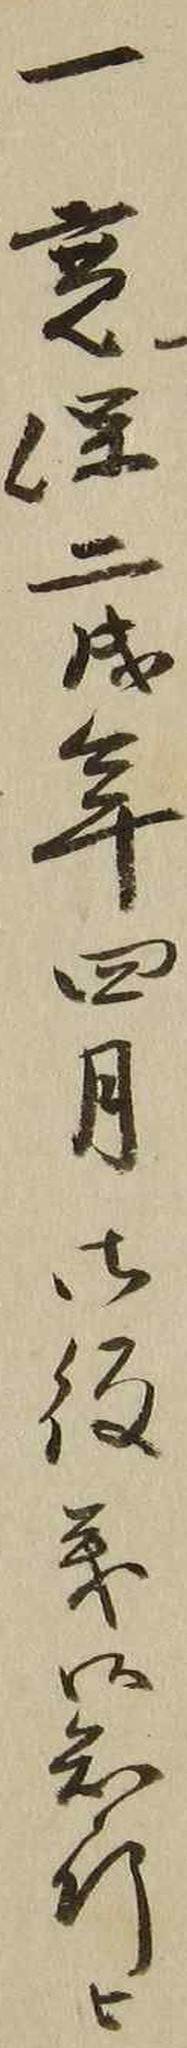一寛保二戌年四月御役義御知行被
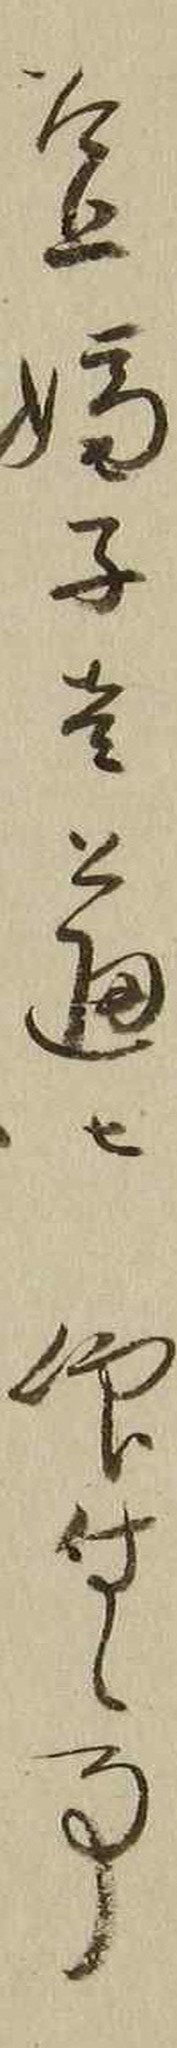召上嫡子常之通被仰付候事
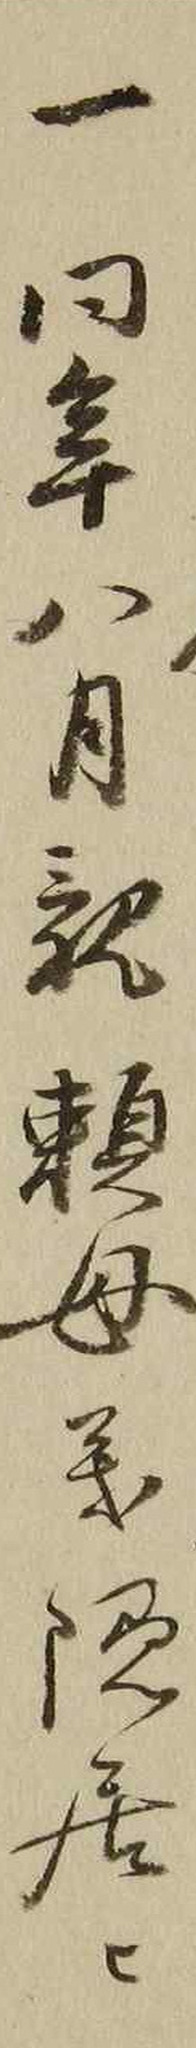一同年八月親賴母義隠居被
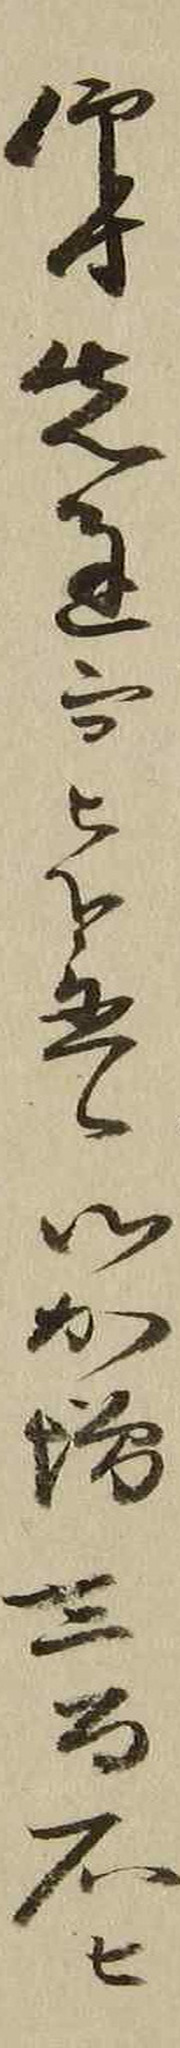仰付先達而被下置候御加増三百石被
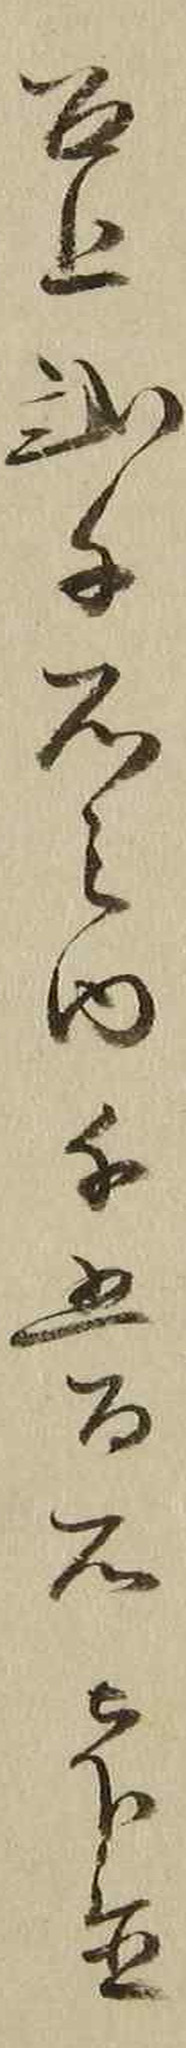召上弐千石之内千五百石被下置
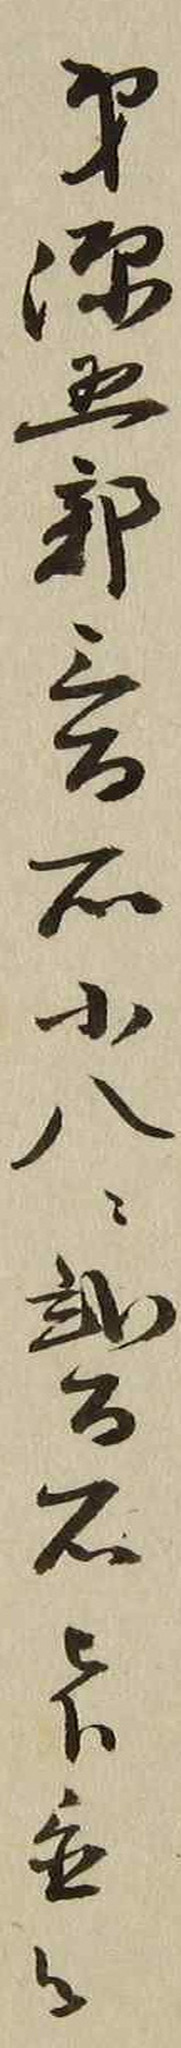弟源五郎三百石小八に弐百石被下置候
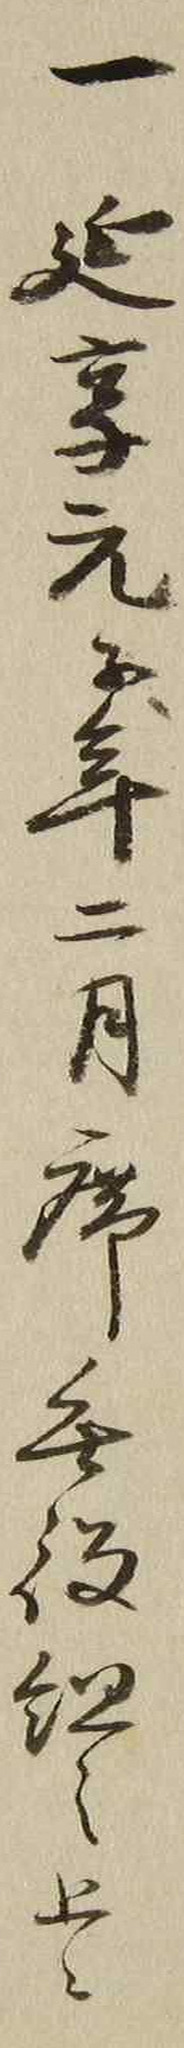一延享元子年二月席無役組之上に
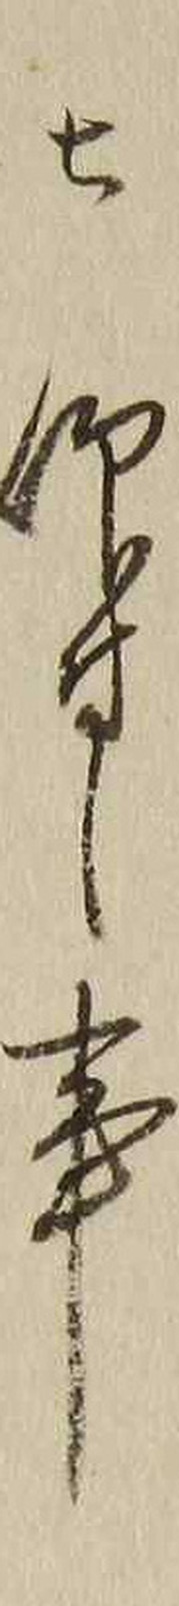被仰付候事
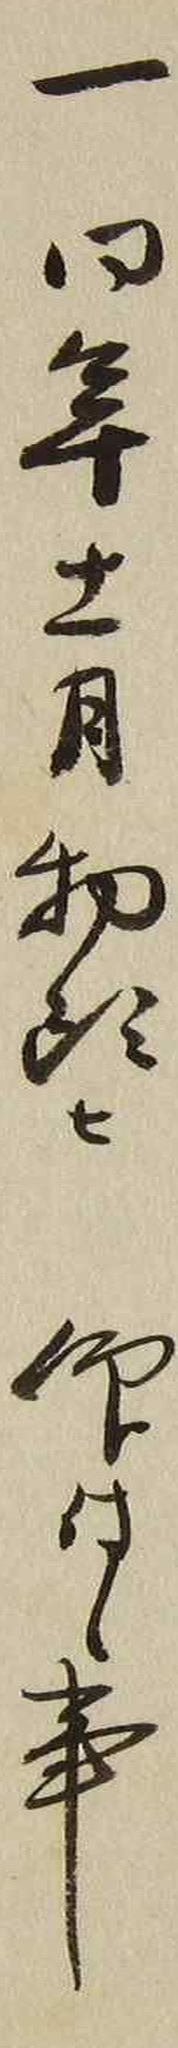一同年十一月物頭被仰付候事
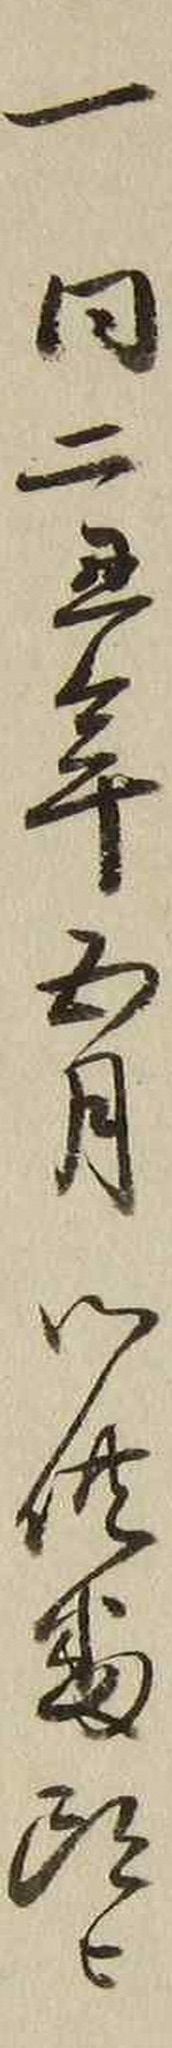一同二丑年五月御供番頭被
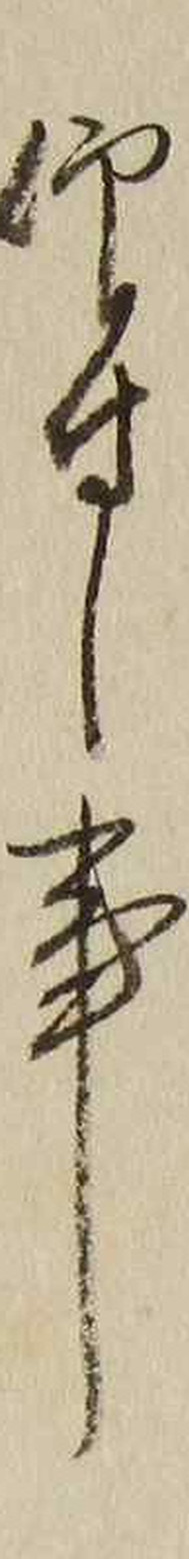仰付候事
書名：諸士系譜　巻之269　さ之部1
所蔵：会津若松市立会津図書館
